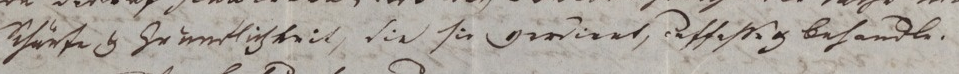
Schärfe & Gründlichkeit, die sie verdient, auffasse & behandle.
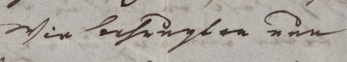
Wir behaupten nun
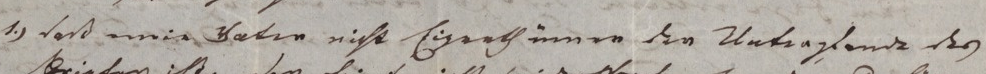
1.) daß mein Vater nicht Eigenthümer der Unterpfande des
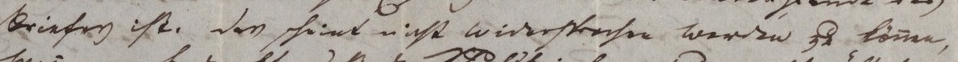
Briefes ist. Das scheint nicht widersprochen werden zu können,
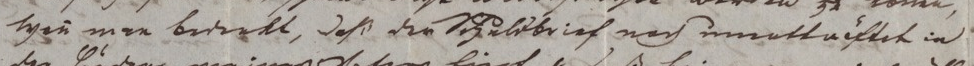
wenn man bedenkt, daß der Schuldbrief noch unentkräftet in
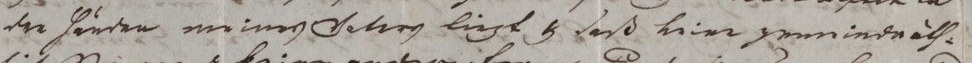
den Händen meines Vaters liegt & daß keine gemeindräth-
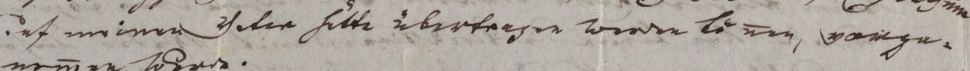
auf meinen Vater hätte übertragen werden können, vorge-
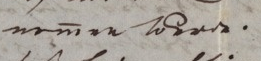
nommen wurde.
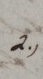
2.)
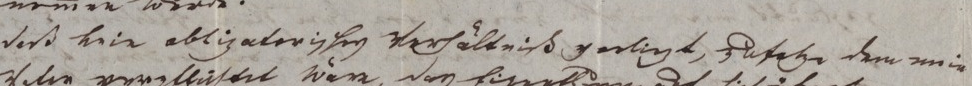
Daß kein obligatorisches Verhältniß vorliegt, zufolge dem mein
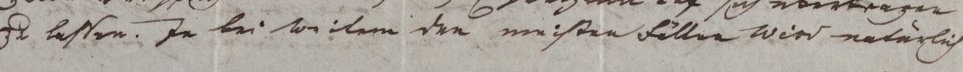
zu lassen. In bei weitem den meisten Fällen wird natürlich
